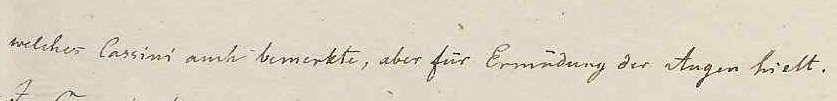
welches Cassini auch bemerkte, aber für Ermüdung der Augen hielt.
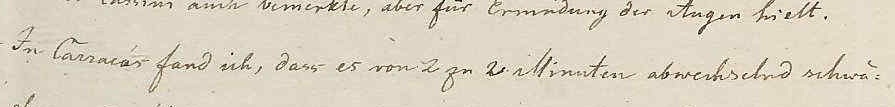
In Carracás fand ich, dass es von 2 zu 2 Minuten abwechselnd schwä-
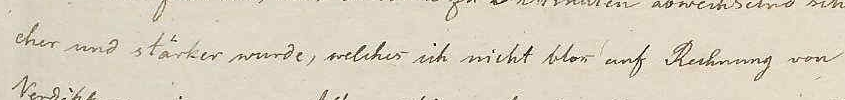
cher und stärker wurde, welches ich nicht blos auf Rechnung von
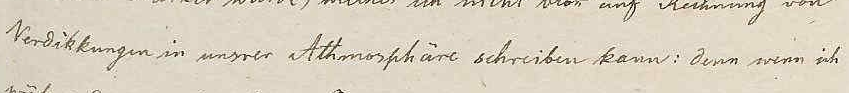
Verdikkungen in unsrer Athmosphäre schreiben kann: denn wenn ich
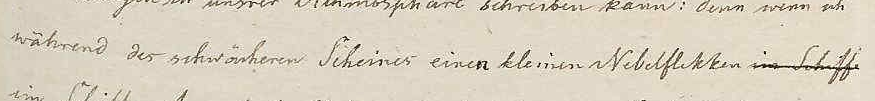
während des schwächeren Scheines einesn kleinen Nebelflekken im Schiffe
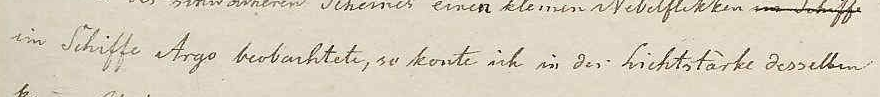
im Schiffe Argo beobachtete, so konte ich in der Lichtstärke desselben
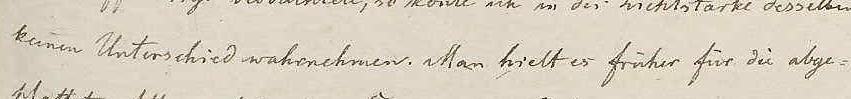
keinen Unterschied wahrnehmen. Man hielt es früher für die abge-
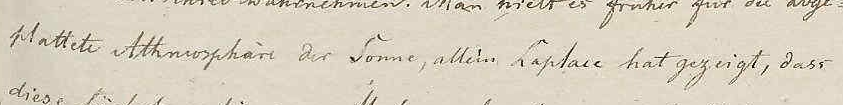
plattete Athmosphäre der Sonne, allein Laplace hat gezeigt, dass
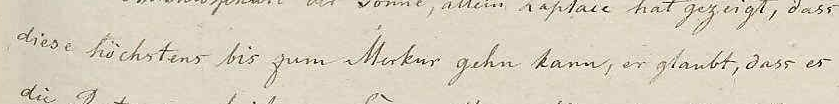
diese höchstens bis zum Merkur gehen kann, er glaubt, dass es
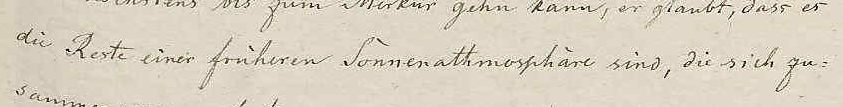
die Reste einer früheren Sonnenathmosphäre sind, die sich zu-
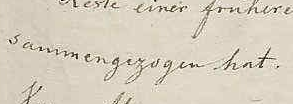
sammengezogen hat.
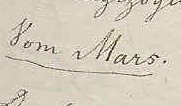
Vom Mars.
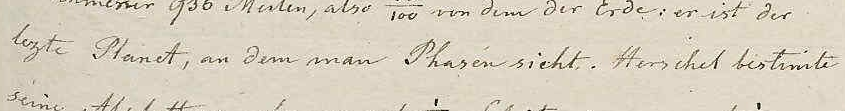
lezte Planet, an dem man Phasen sieht. Herschel bestimte
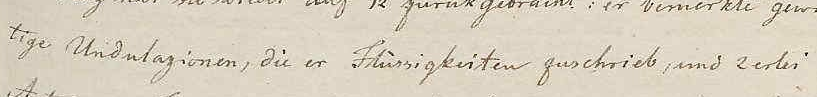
tige Undulazionen, die er Flüssigkeiten zuschrieb, und 2erlei
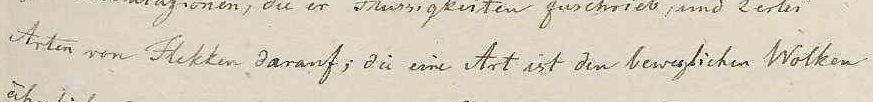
Arten von Flekken darauf; die eine Art ist den beweglichen Wolken
